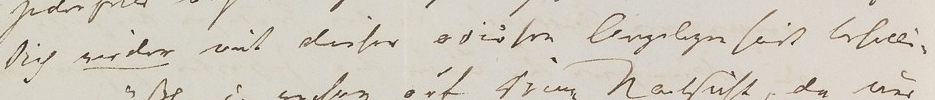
Dich wieder mit dieser odiösen Angelegenheit behelli-
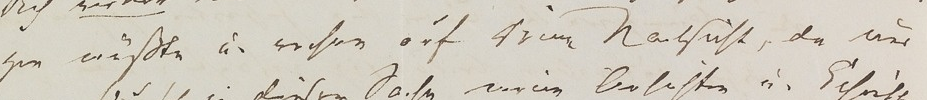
gen mußte u. rechne auf Deine Nachsicht, da nur
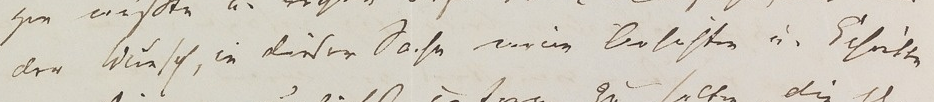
der Wunsch, in dieser Sache meine Ansichten u. Schritte
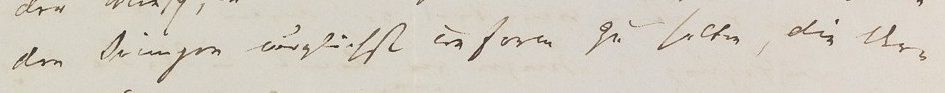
den Deinigen möglichst conform zu halten, die Ver-
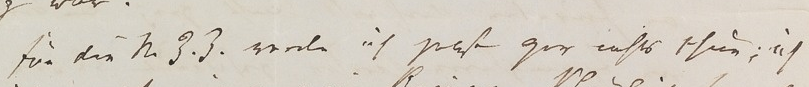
Für die N.Z.Z. werde ich jetzt gar nichts thun; ich
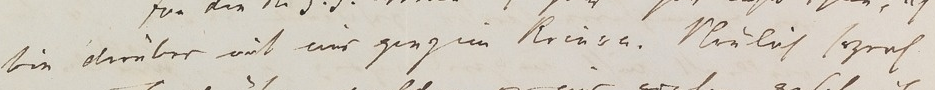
bin darüber mit mir ganz im Reinen. Neulich sprach
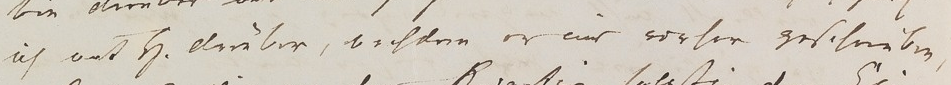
ich mit H. darüber, nachdem er mir vorher geschrieben,
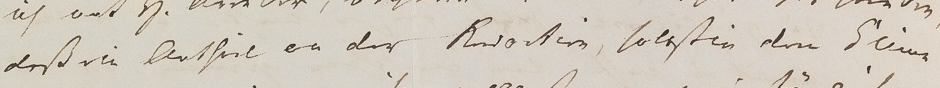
daß ein Antheil an der Redaction, selbst in dem Sinne
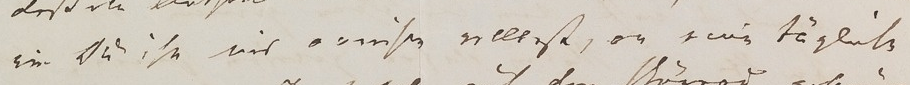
wie Du ihn mir erweisen wolltest, an eine tägliche
